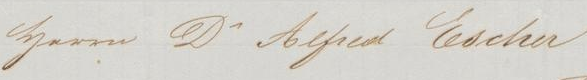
Herrn Dr Alfred Escher
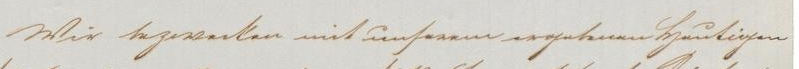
Wir bezwecken mit unserem ergebenen Heutigen
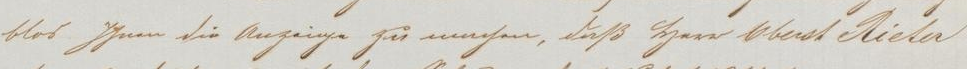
blos Ihnen die Anzeige zu machen, daß Herr Oberst Rieter
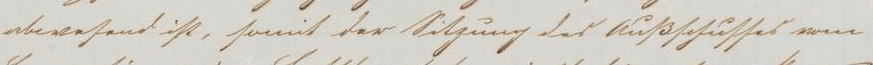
abwesend ist, somit der Sitzung des Außschusses vom
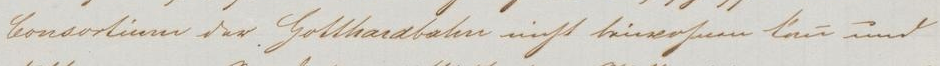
Consortium der Gotthardbahn nicht beiwohnen kann und
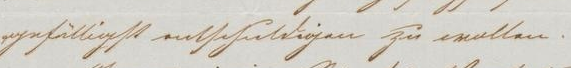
gefälligst entschuldigen zu wollen. –
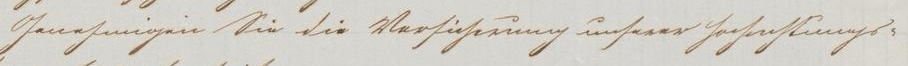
Genehmigen Sie die Versicherung unserer hochachtungs-
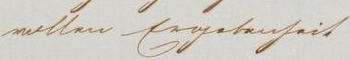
vollen Ergebenheit
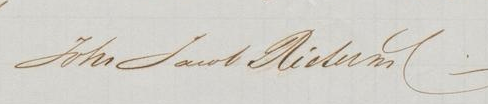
Joh. Jacob Rieter &
